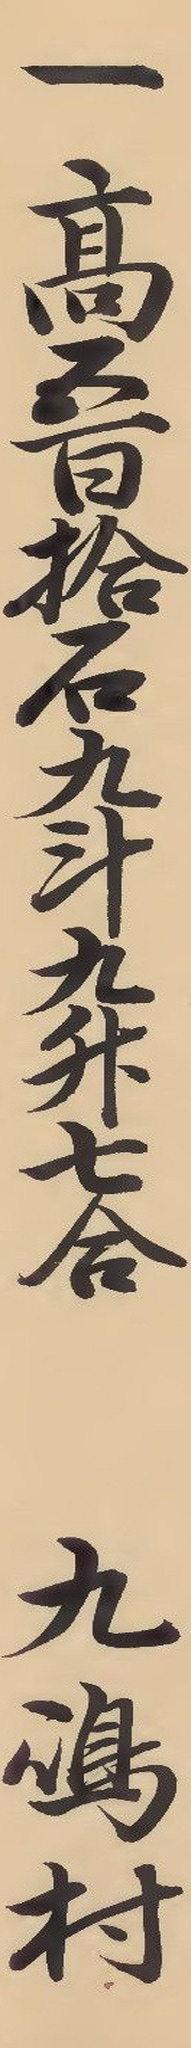一高五百拾石九斗九升七合九島村
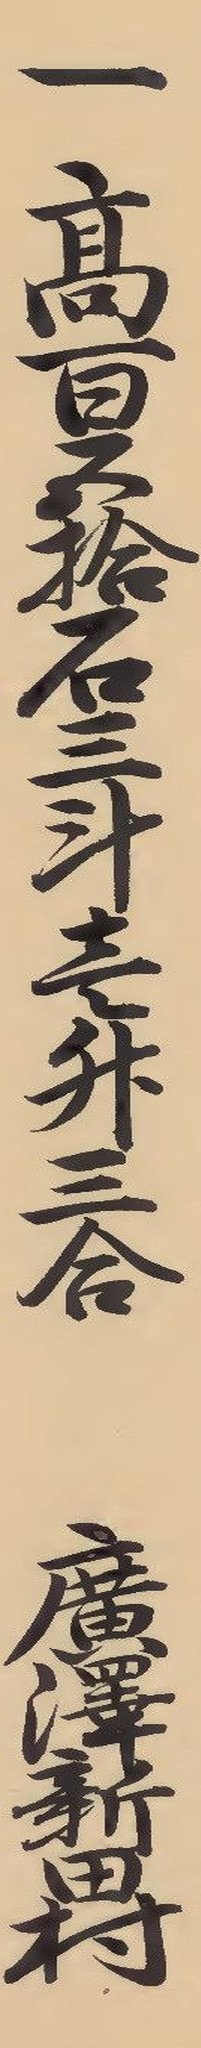一高百五拾石三斗壱升三合広沢新田村
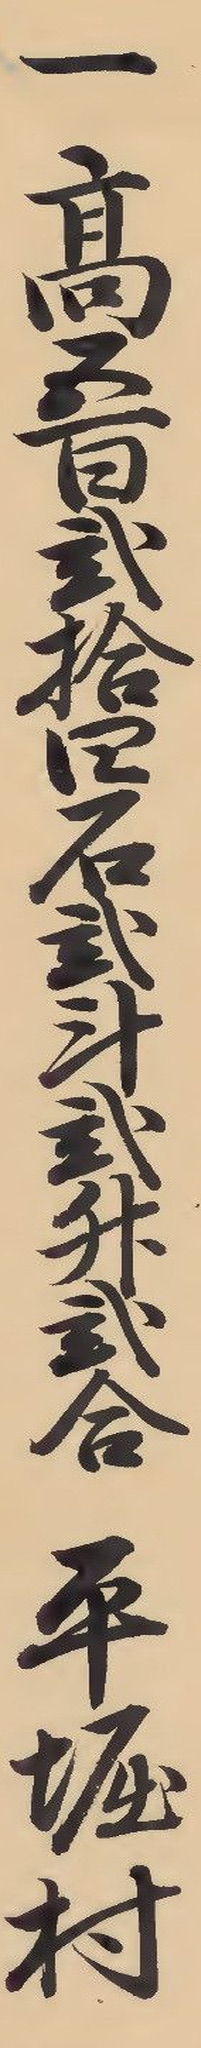一高五百弐拾四石弐斗弐升弐合平堀村

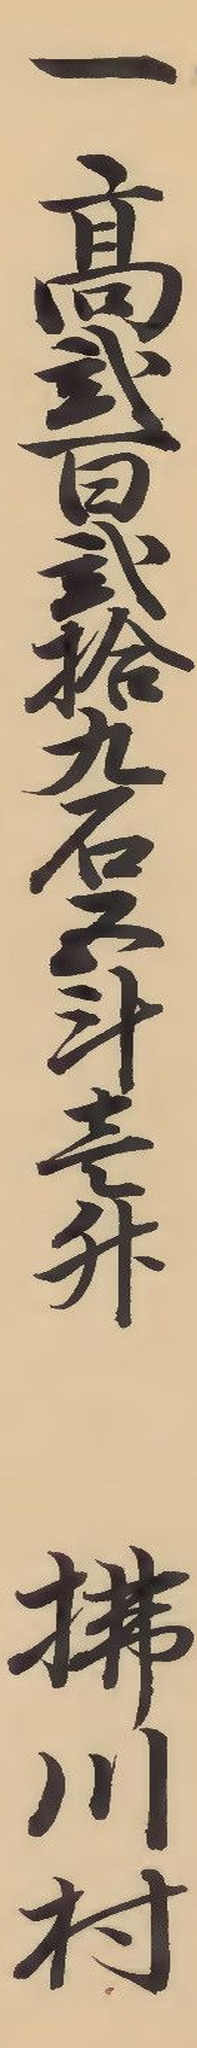一高弐百弐拾九石五斗壱升払川村
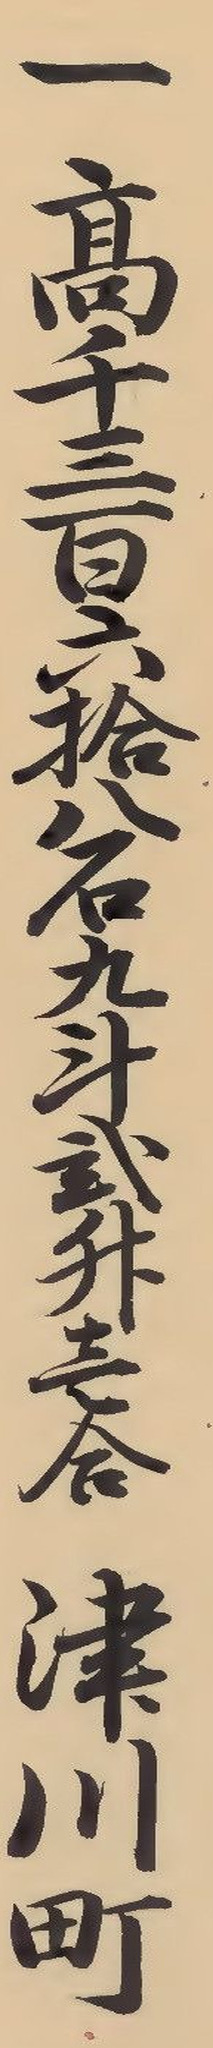一高千三百六拾八石九斗弐升壱合津川町
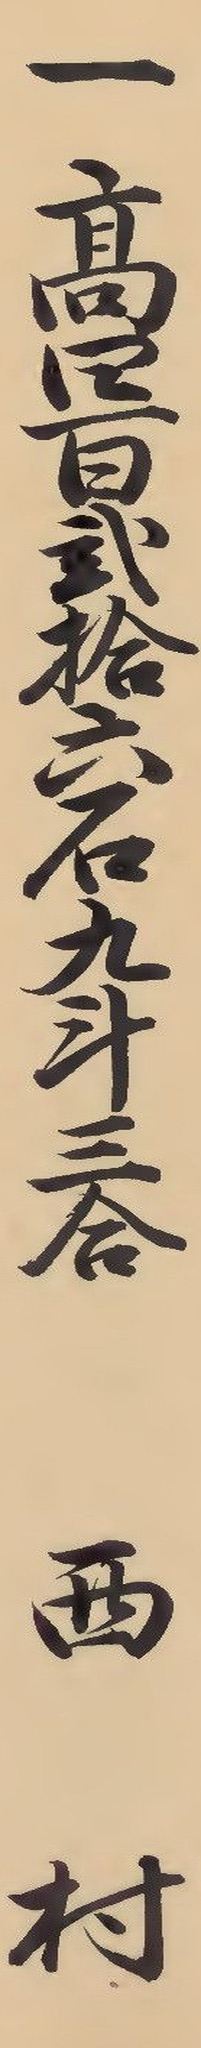一高四百弐拾六石九斗三合西村
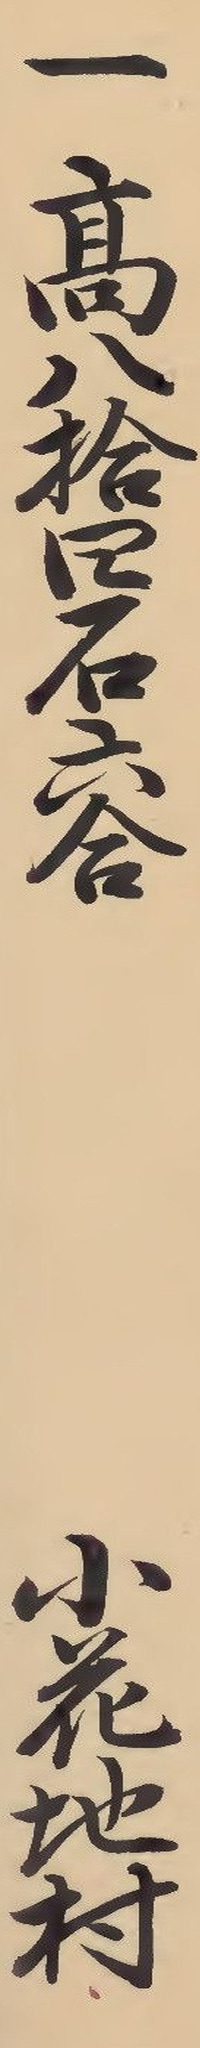一高八拾四石六合小花地村
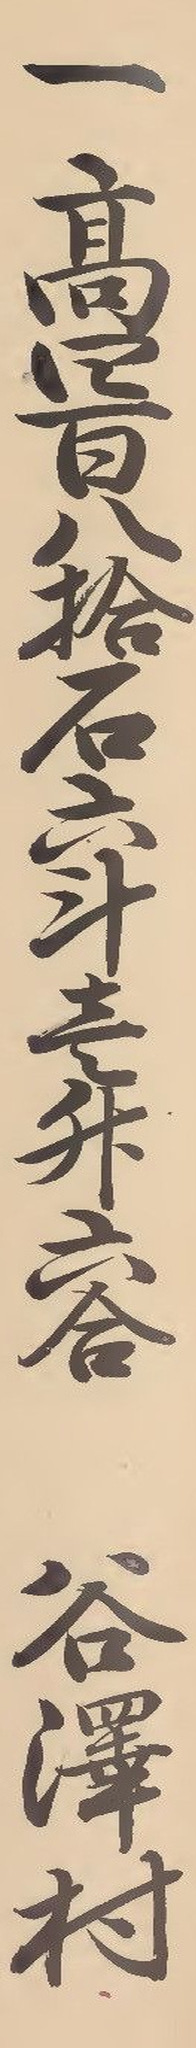一高四百八拾石六斗壱升六合谷沢村
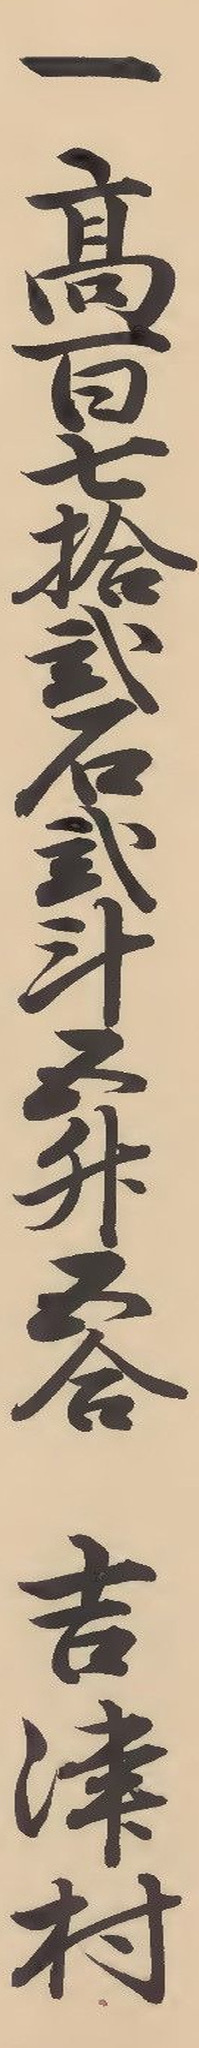一高百七拾弐石弐斗五升五合吉津村
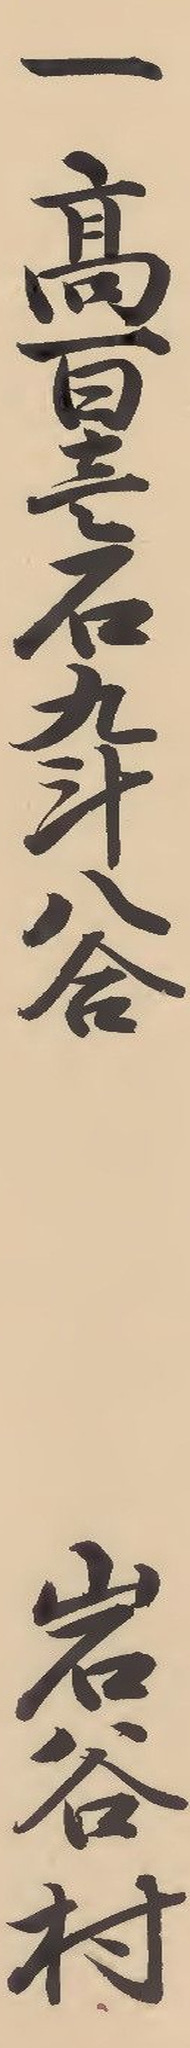一高百壱石九斗八合岩谷村
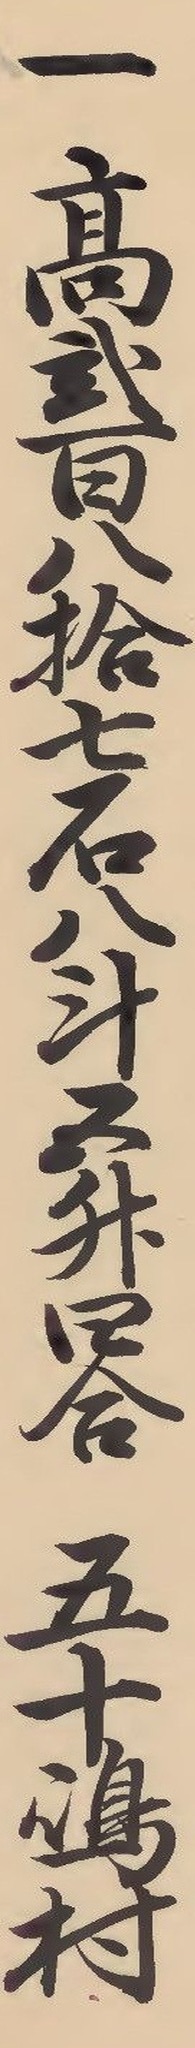一高弐百八拾七石八斗五升四合五十島村

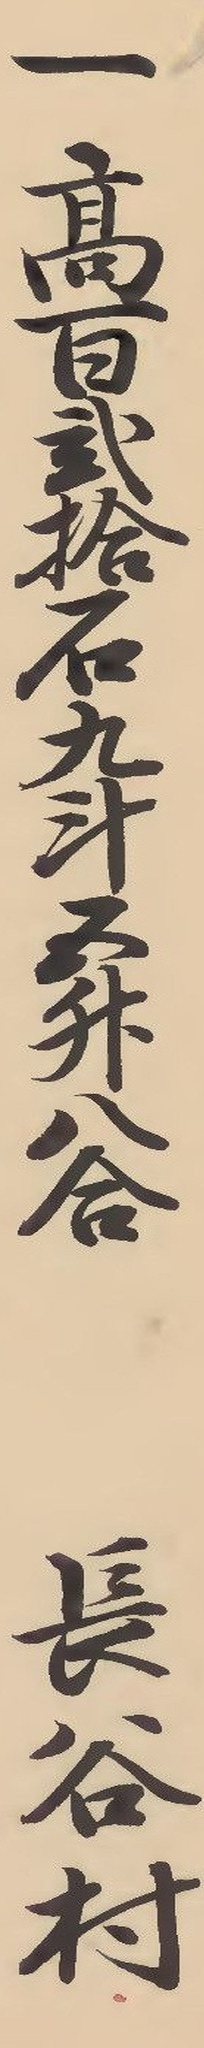一高百弐拾石九斗五升八合長谷村
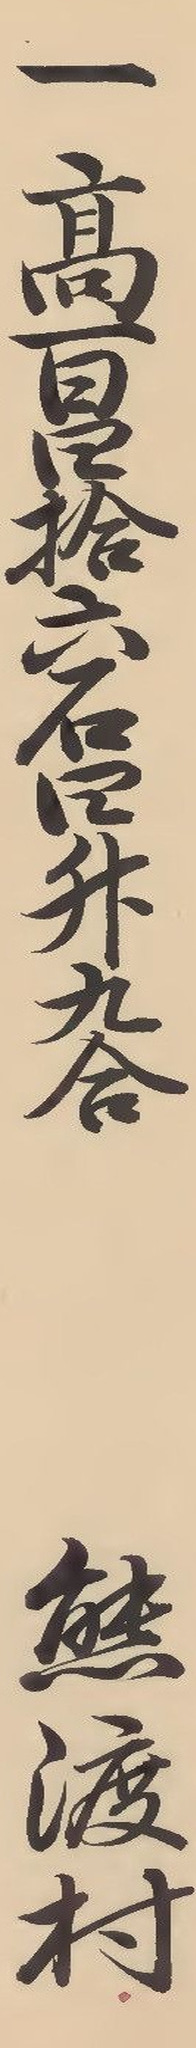一高百四拾六石四升九合熊渡村
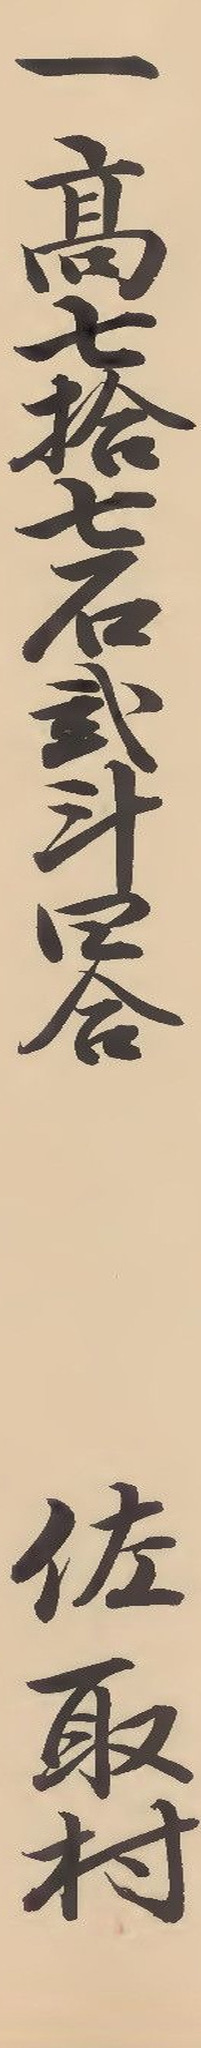一高七拾七石弐斗四合佐取村
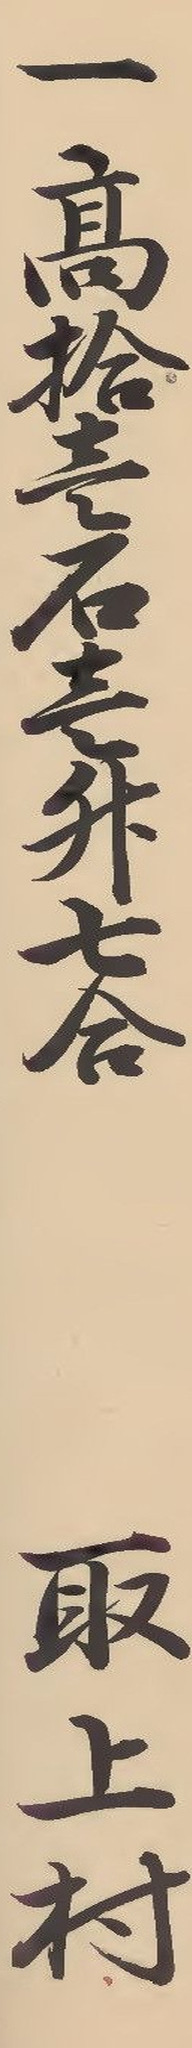一高拾壱石壱升七合取上村
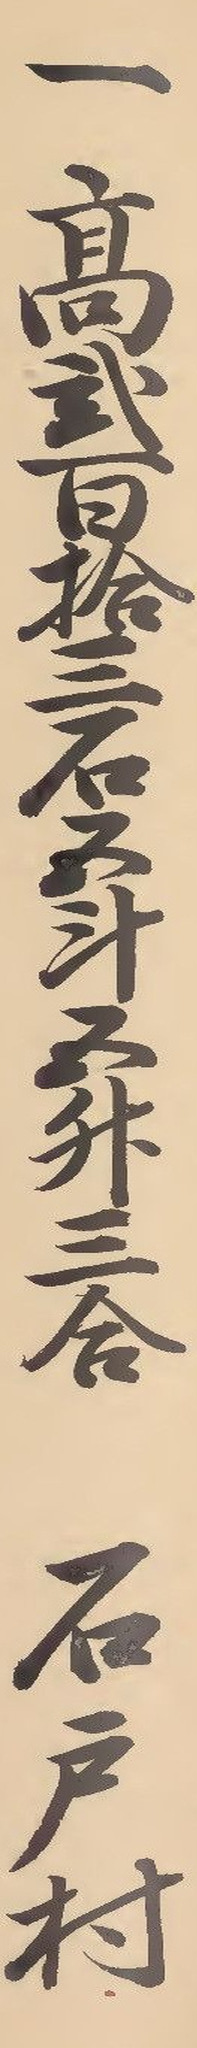一高弐百拾三石五斗五升三合石戸村
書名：越後国郷帳　下
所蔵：国立公文書館 National Archives of Japan
